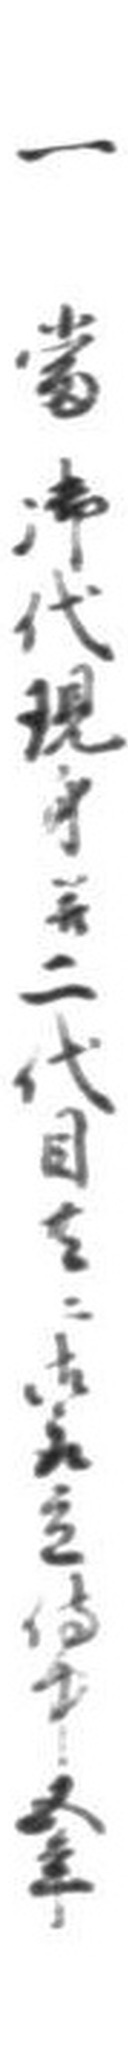一当御代現身并二代目共ニ御取立侍中五年
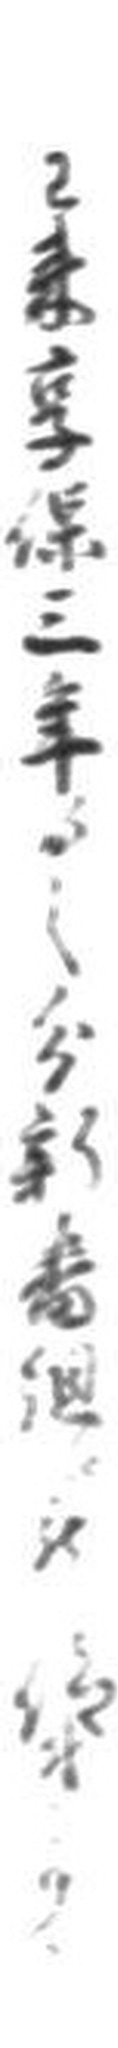已来享保三年ゟ之分新番組江被仰付
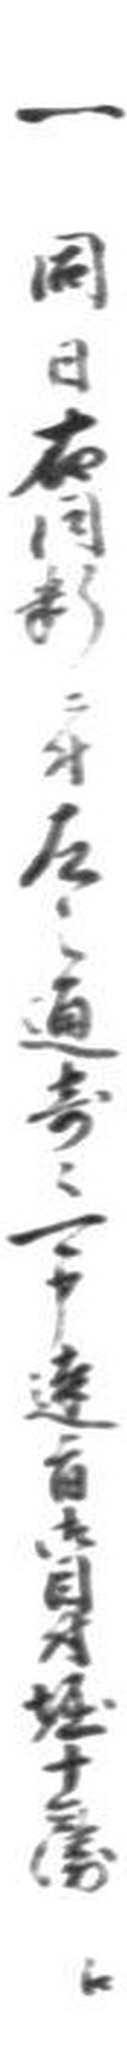一同日右同断ニ付左之通寄々可申達旨御目付堀十兵衛江
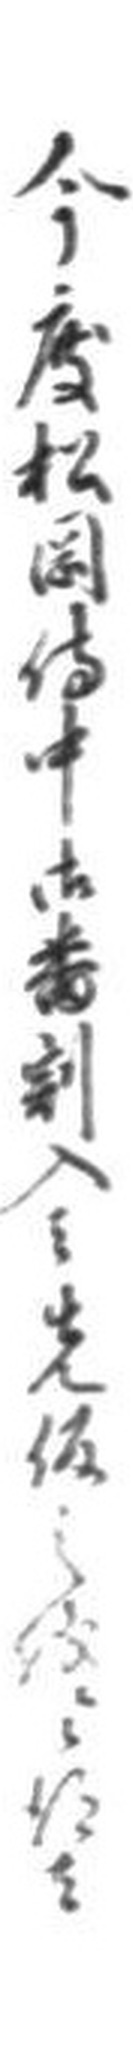今度松岡侍中御番割入者先仮之儀ニ候得共
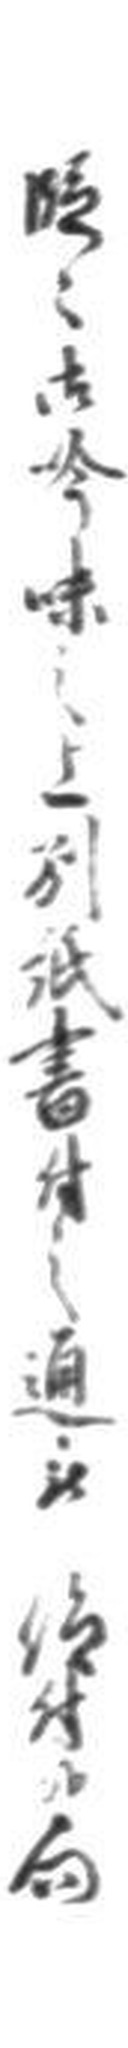段々御吟味之上別紙書付之通被仰付候向
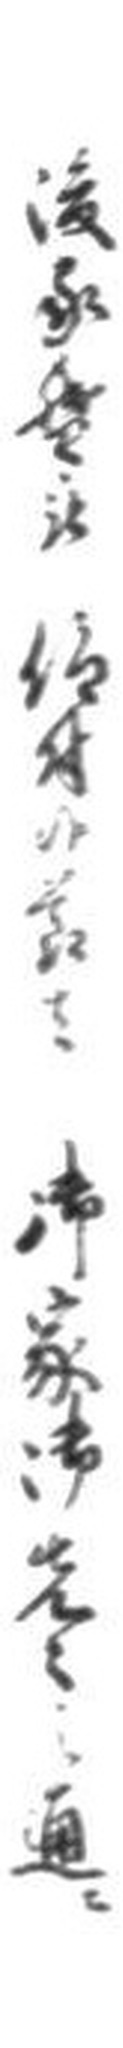後家督被仰付候節者御家御先々之通ニ

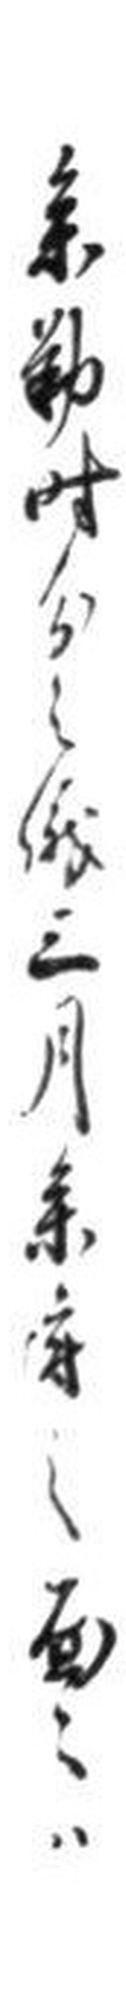参勤時分之儀三月参府之面々ハ
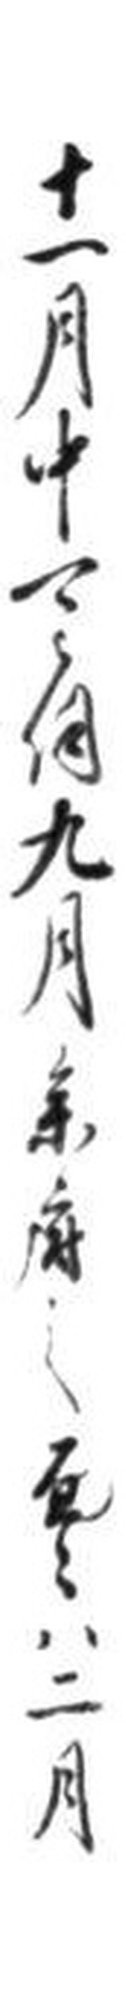十一月中可被伺九月参府之面々ハ二月
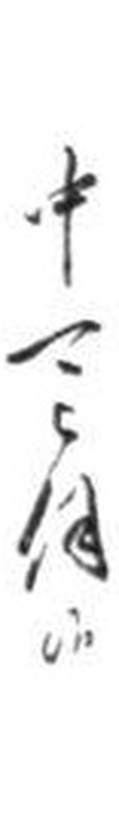中可被伺候
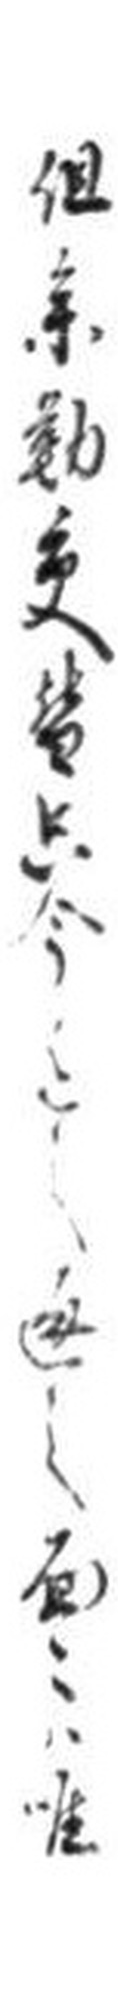但参勤交替只今迄之通之面々ハ唯
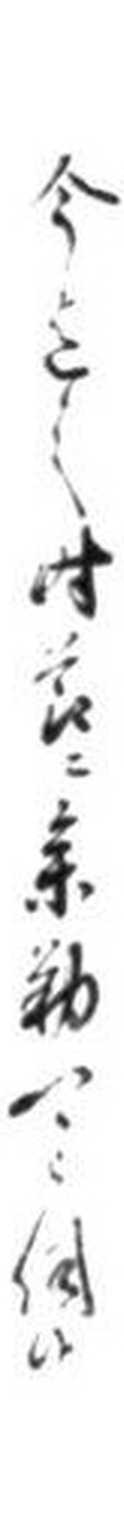今迄之時節ニ参勤可被伺候
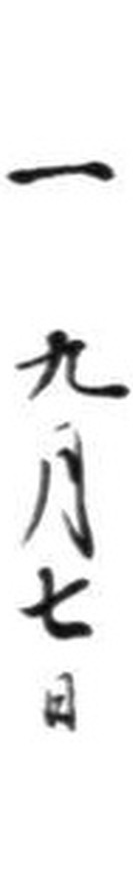一九月七日
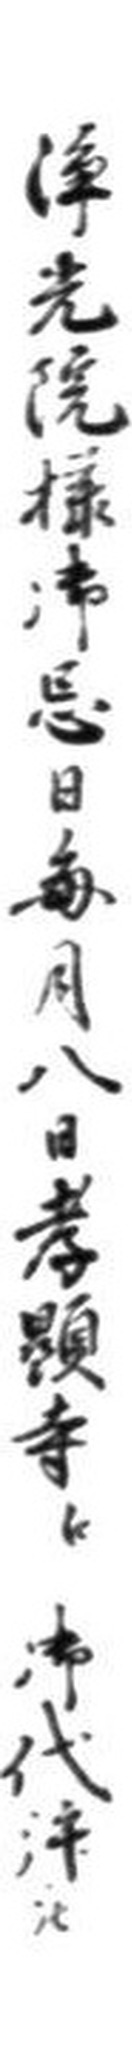浄光院様御忌日毎月八日孝顕寺江御代拝被
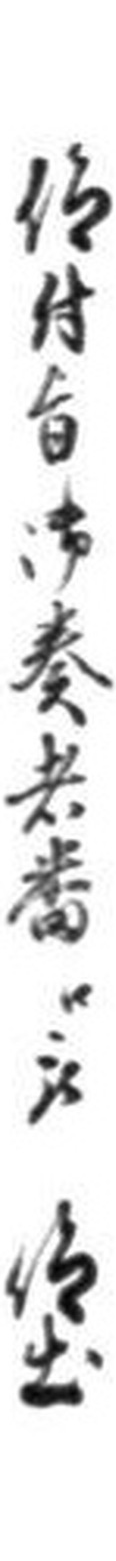仰付旨御奏者番江被仰出
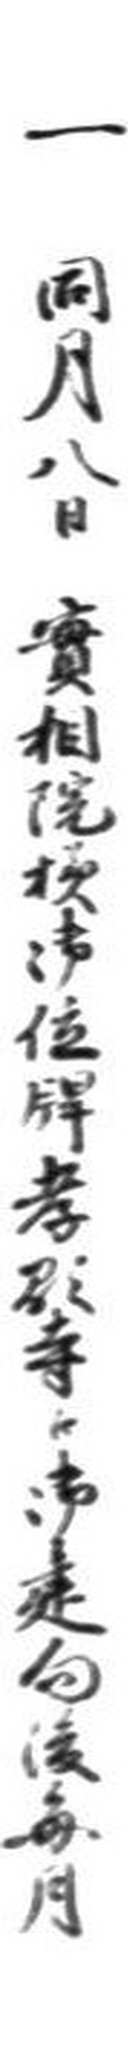一同月八日実相院様御位牌孝顕寺江御建向後毎月
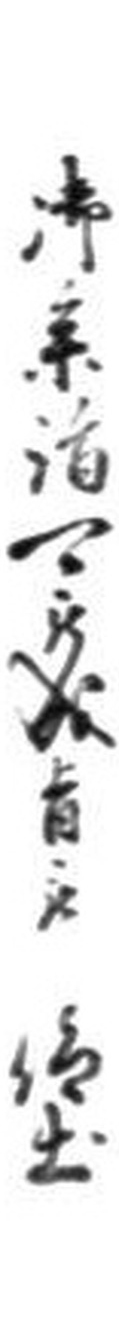御参詣可被成旨被仰出
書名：家譜 三十五 宗昌公 従享保六年到同七年
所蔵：福井県文書館 Fukui Prefectural Archives
